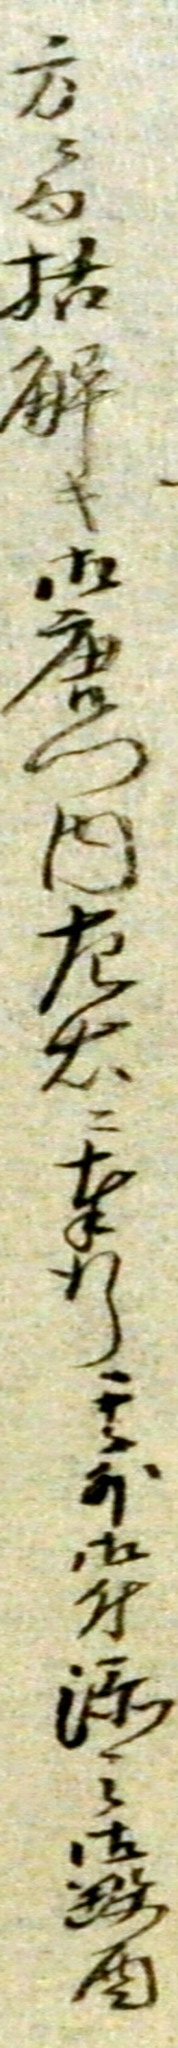方ニ而括解キ御唐門内左右二奉行其外御付添之御医師
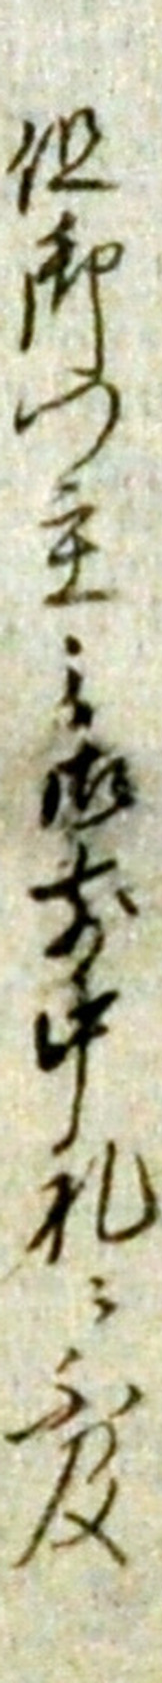但御門主之御前中礼ニ不及
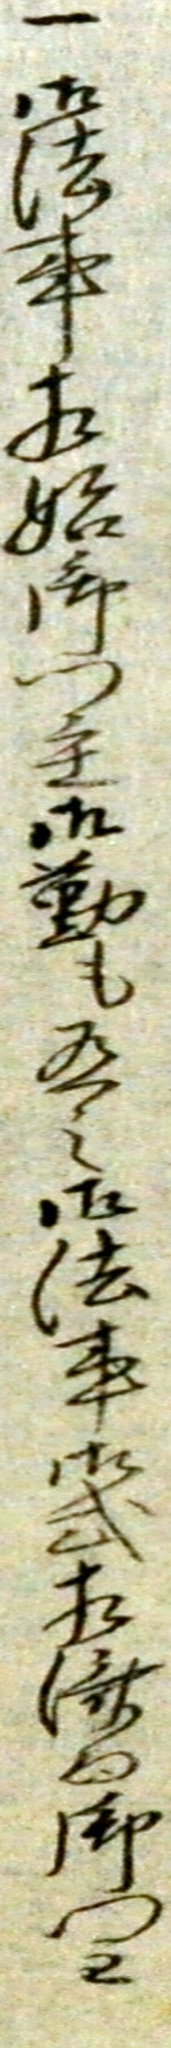一御法事相始御門主御勤も有之御法事御式相済而御門主
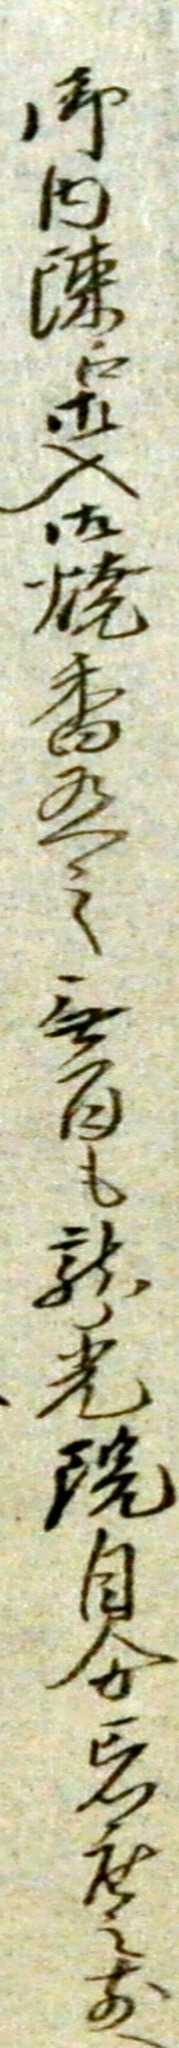御内陣江直入御焼香有之無間も龍光院自分着座之前へ
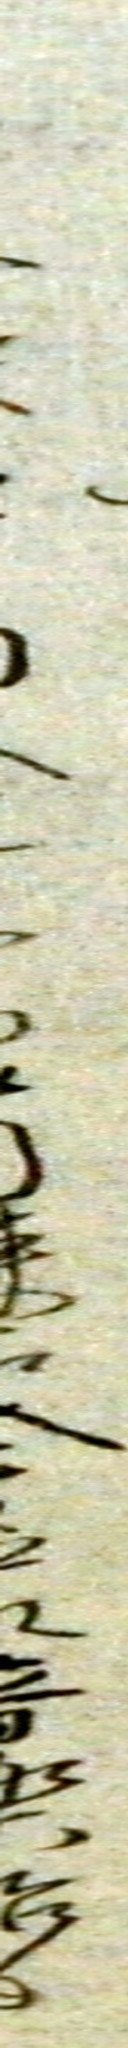参り会釈有之同人先立二而御内陣江入其節音楽始る

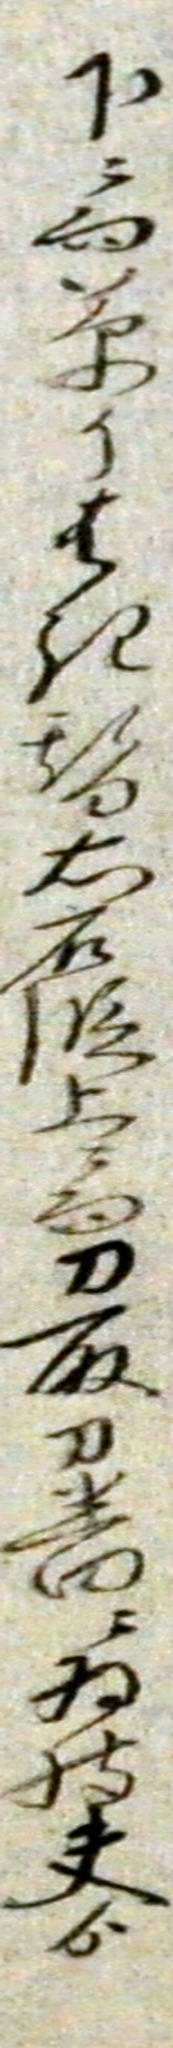下ニ而草り者起替右石段上二而刀取刀番二為持夫ゟ
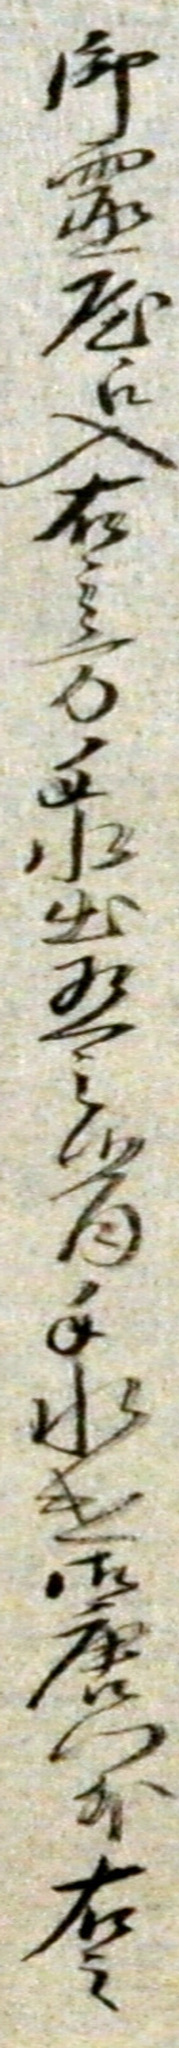御霊屋江入右之方手水出有之候間手水遣御唐門外右之方
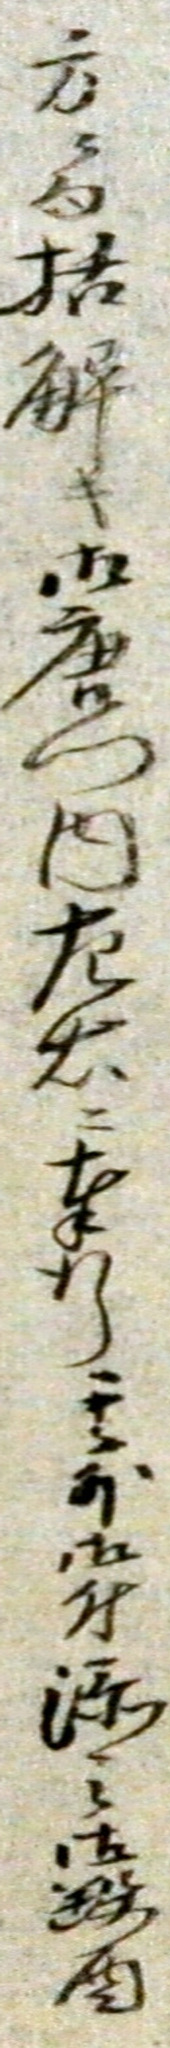ニ而括解キ御唐門内左右二奉行其外御付添之御医師
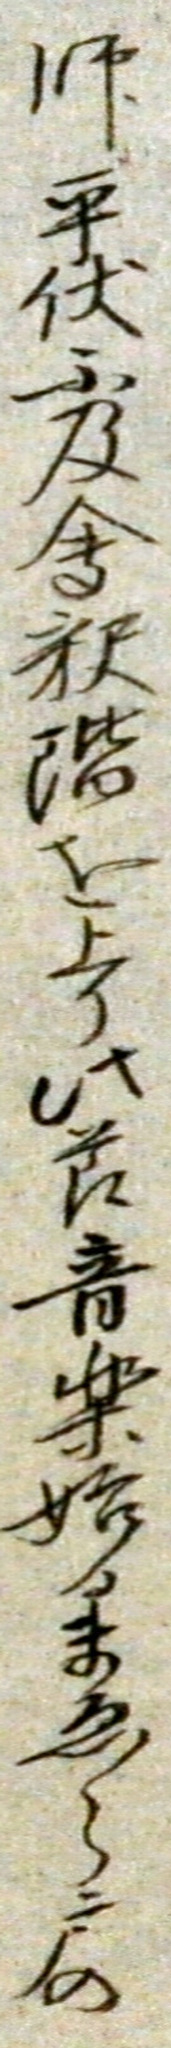平伏不及会釈階を上り此節音楽始るまゑ之戸の
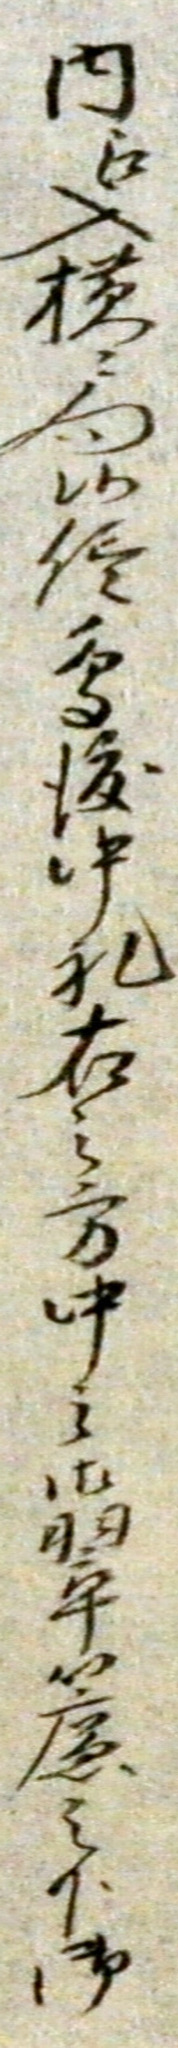内江入横二向候儘鳥渡中礼右之方中之御翠簾之下御
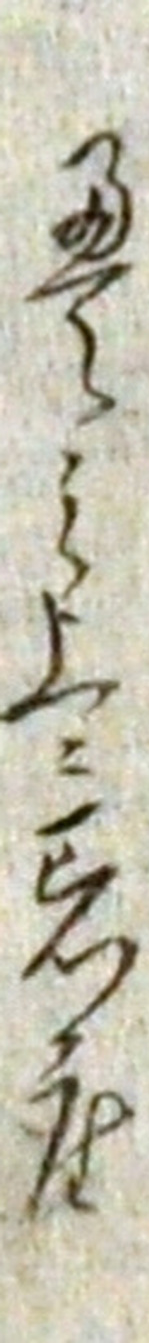畳之上ニ着座
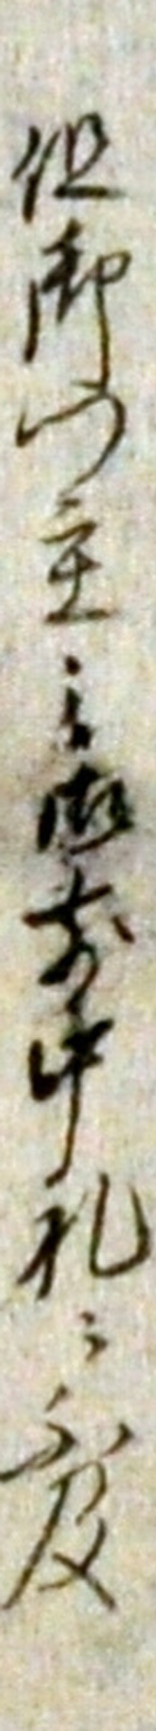但御門主之御前中礼ニ不及
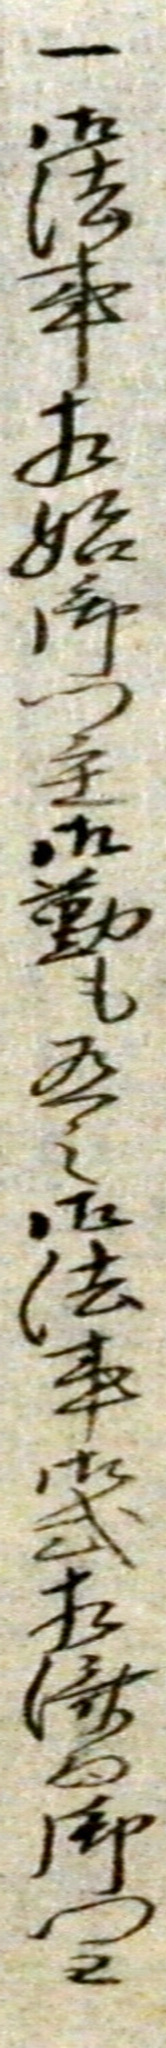一御法事相始御門主御勤も有之御法事御式相済而御門主
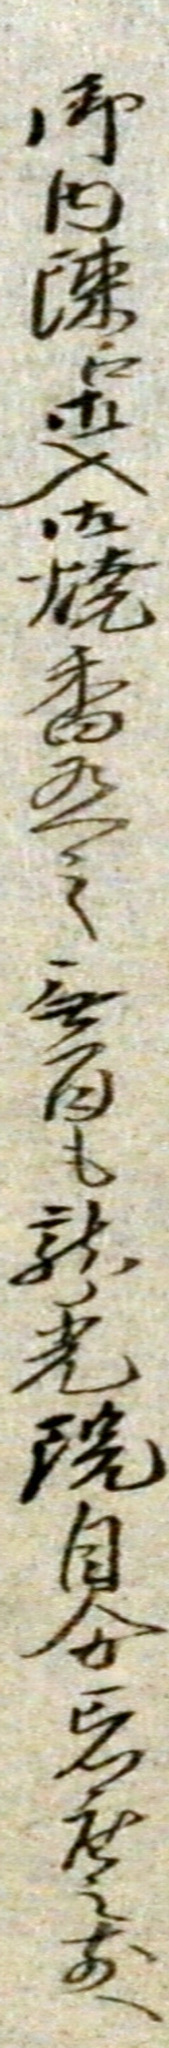御内陣江直入御焼香有之無間も龍光院自分着座之前へ
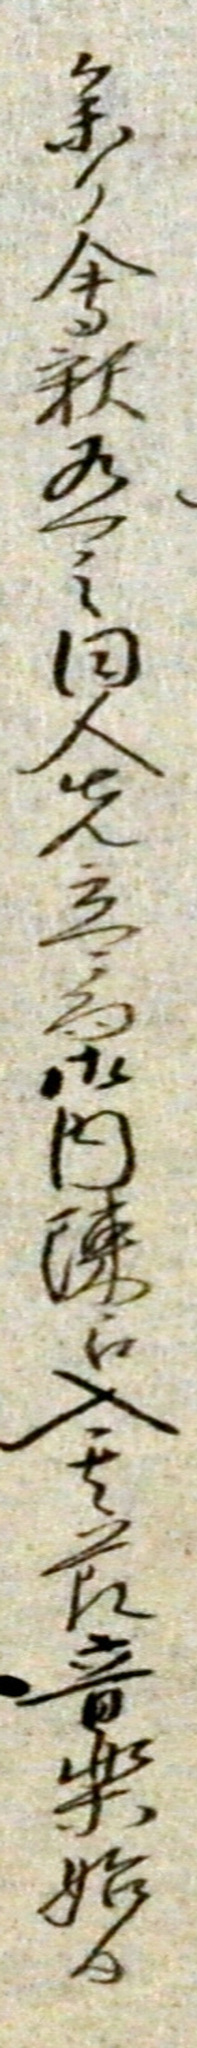参り会釈有之同人先立二而御内陣江入其節音楽始る
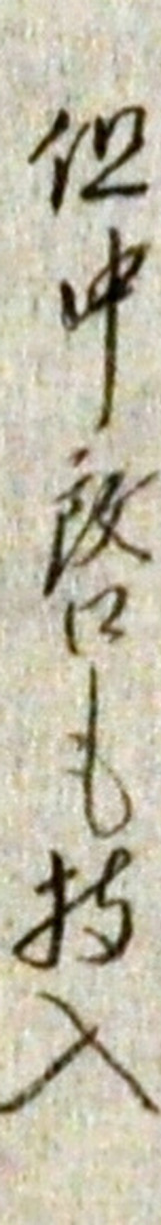但中啓も持入
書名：日光御名代相勤候節ノ留
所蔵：伊那市立高遠町図書館・合同会社AMANE
